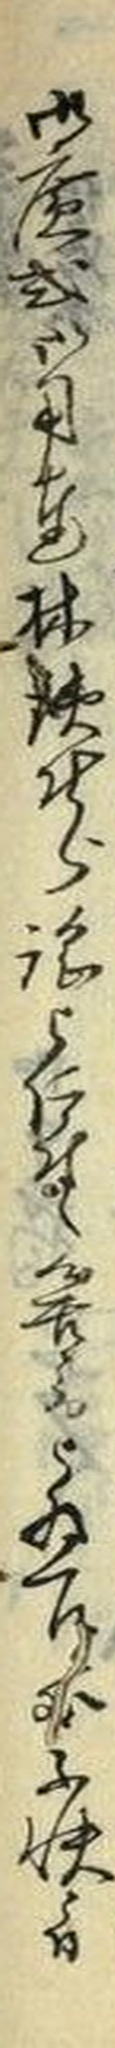御広式御用達林鉄次郎謡被仰付候筈ニ而被為召候処不快ニ付
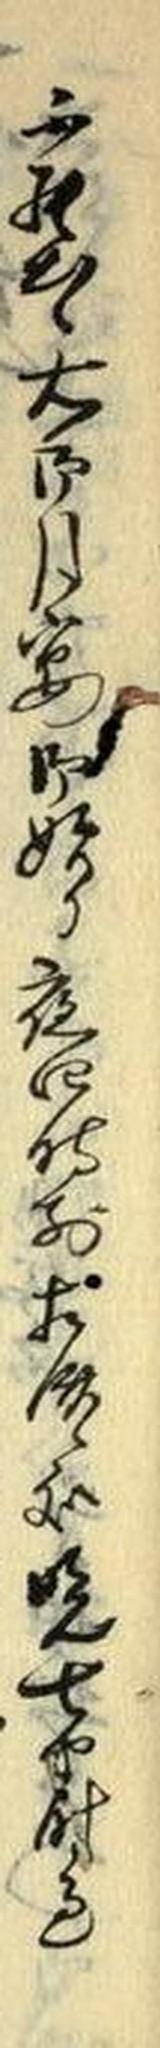不罷出候右御月宴御始り夜四時前相済候処暁七半時過
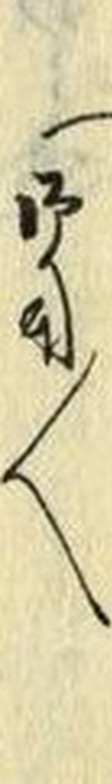御用人
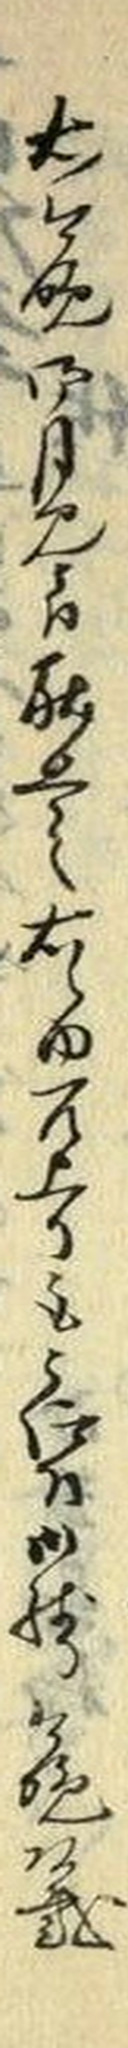右今晩御月見ニ付献上之右之内召上りニも被仰付御残り今晩頂戴
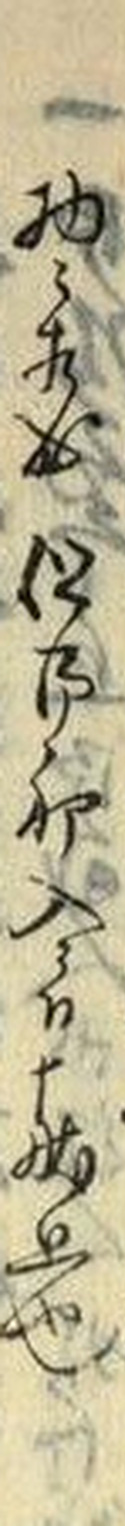物ニ相成但御初入ニ付献上也
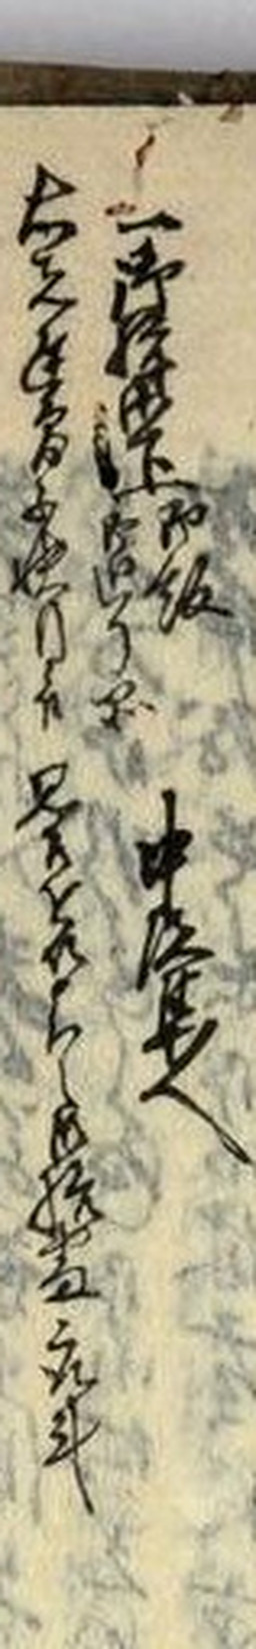右先達而ゟ不快引ニ付思召を以被下之御膳番取計
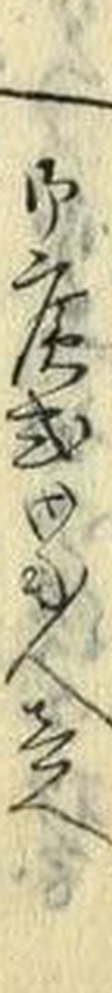御広式御用人壱人
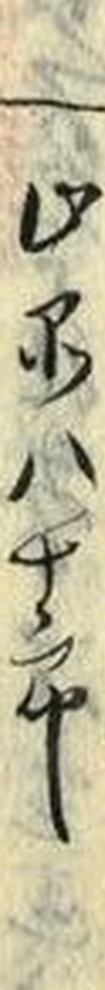山品八十郎
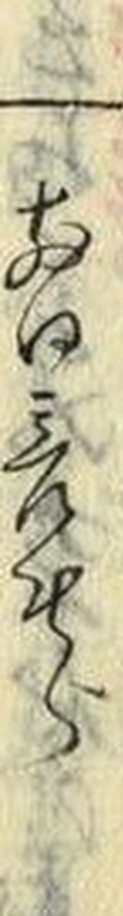前田彦次郎
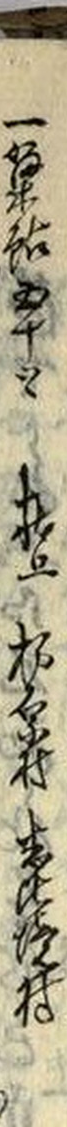一簗鮎五十ツヽ献上栃泉村志比境村
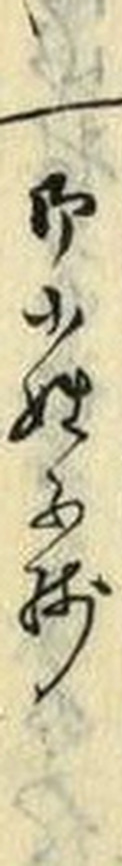御小姓不残
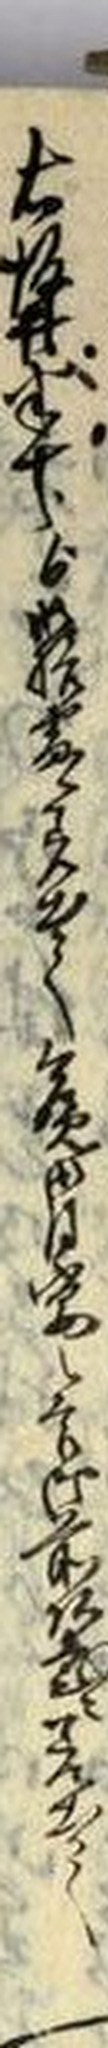右坂井半十郎ゟ御膳番へ差出之今晩御月宴之節御前頂戴ニ差出之
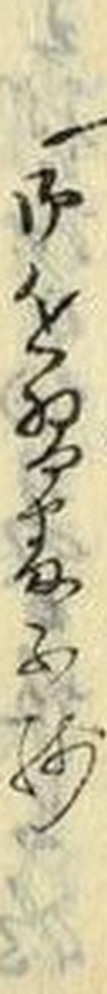御近習番不残
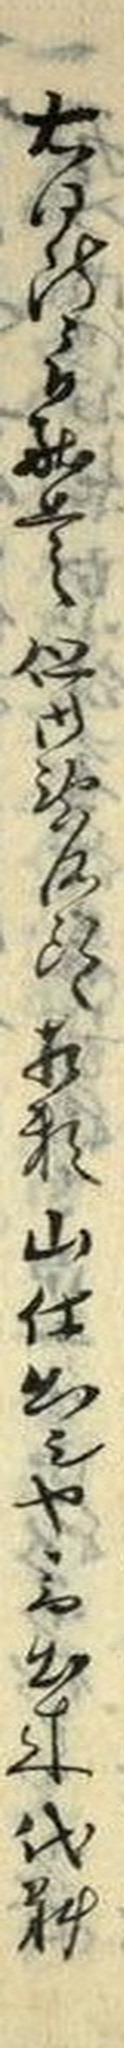右同断ニ付献上之但御台所頭へ相頼山仕出シヤニ而出来代料
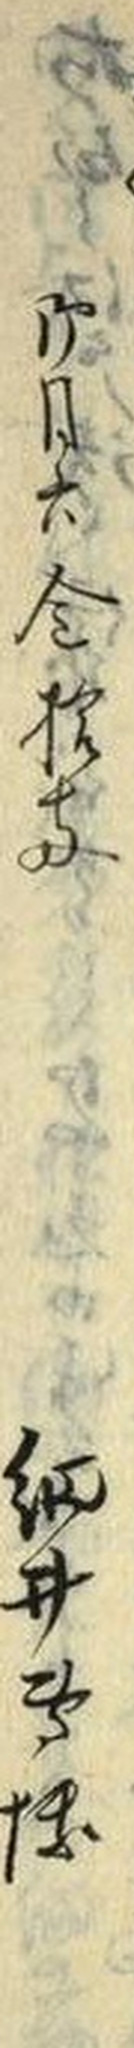御目六金拾両細井専博

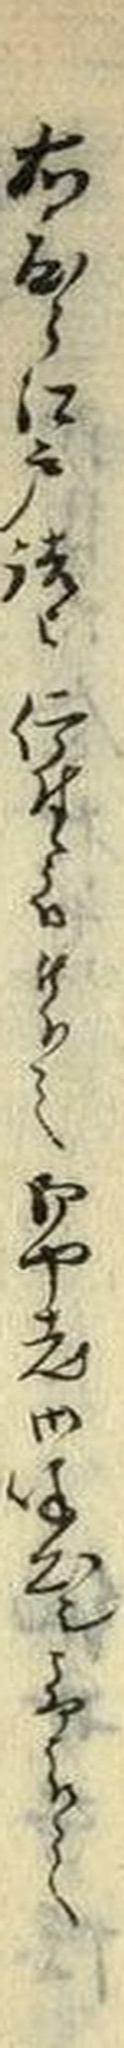右度々江戸詰被仰付候ニ付被下之御中老御呼出シニ而被下之
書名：少傅日録抄（斉承付側向頭取日記、在国）
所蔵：福井県文書館 Fukui Prefectural Archives
